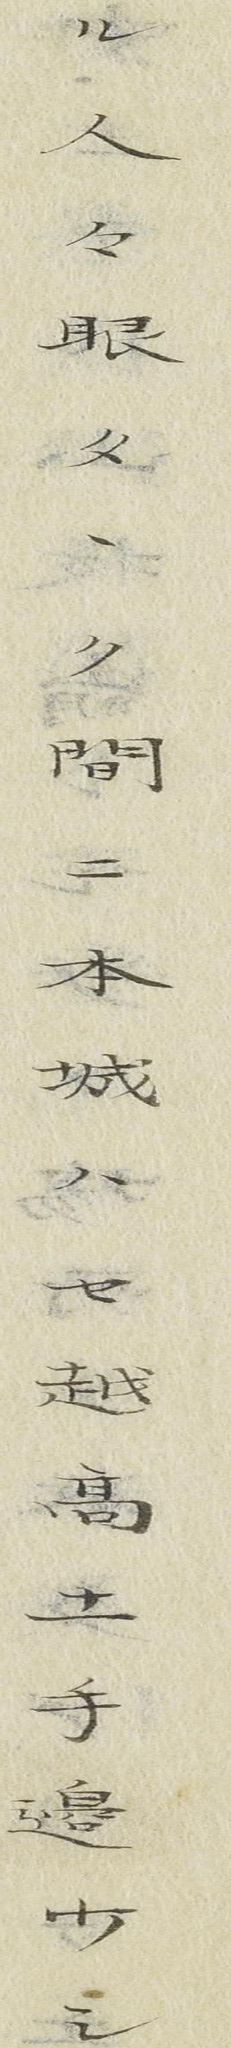ル人々眼タヽク間ニ本城ハセ越高土手辺少シ
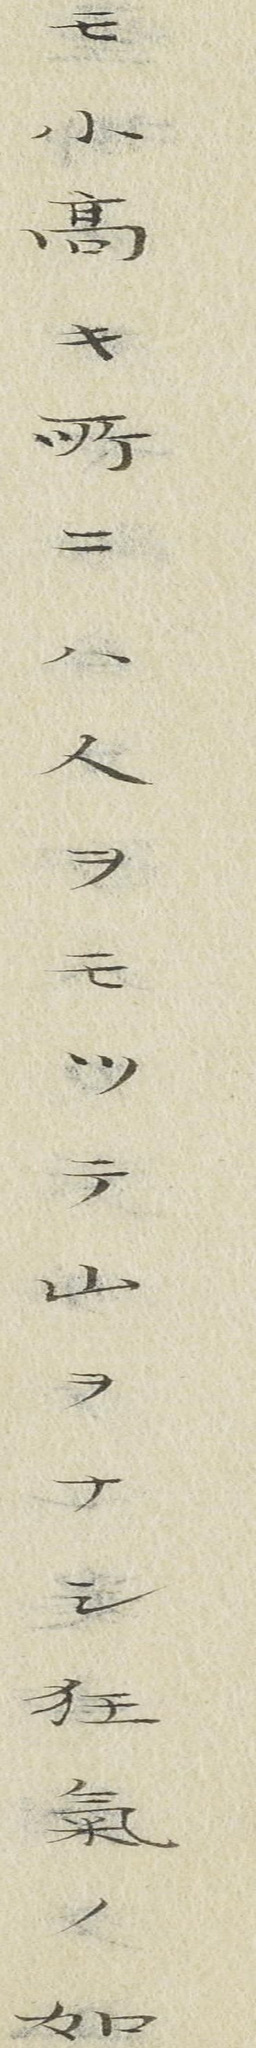モ小高キ所ニハ人ヲモツテ山ヲナシ狂気ノ如
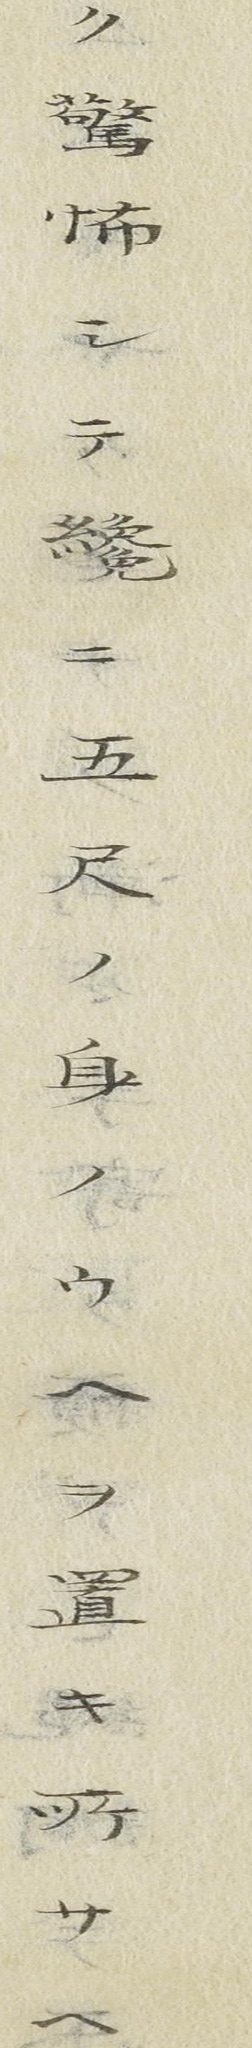ク驚怖シテ纔ニ五尺ノ身ノウヘヲ置キ所サヘ
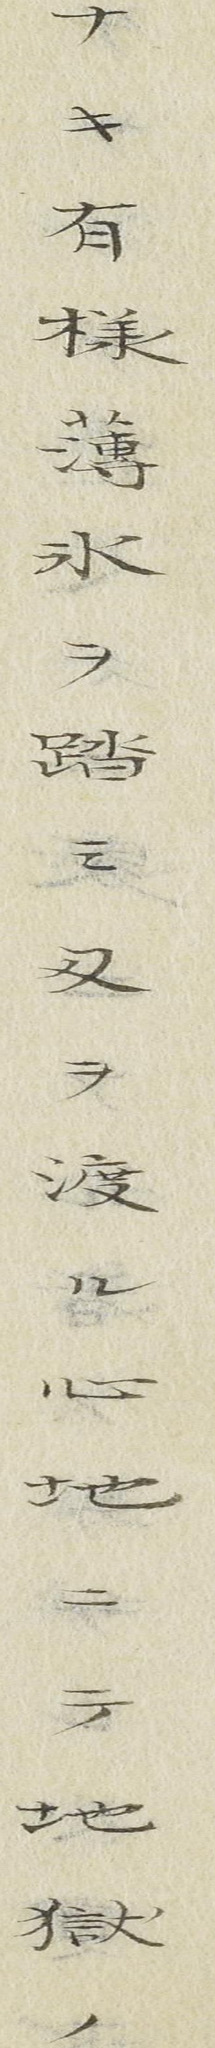ナキ有様薄氷ヲ踏ミ刃ヲ渡ル心地ニテ地獄ノ
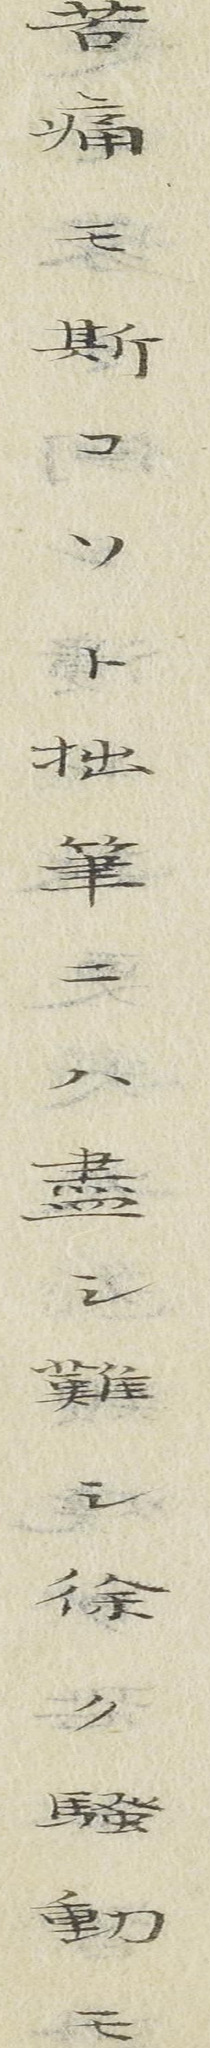苦痛モ斯コソト拙筆ニハ尽シ難シ徐ク騒動モ
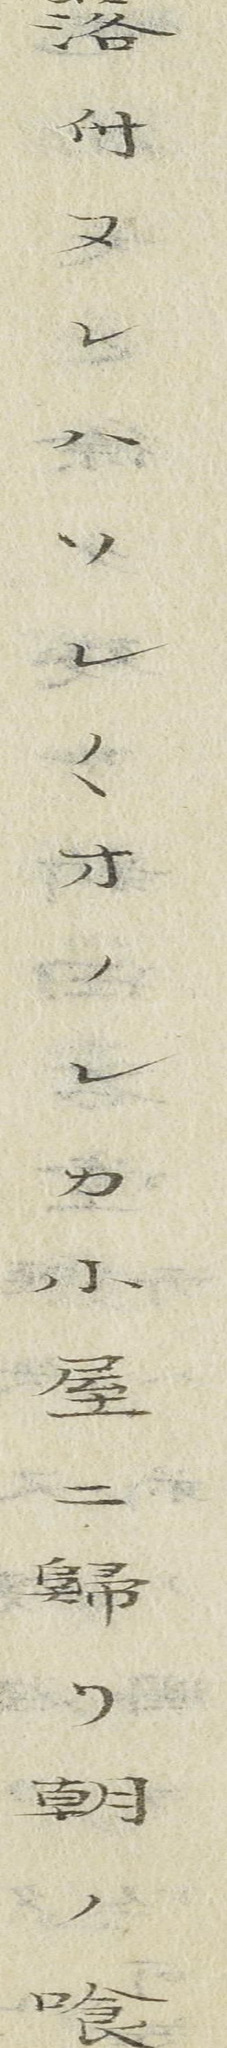落付ヌレハソレ〱オノレカ小屋ニ帰リ朝ノ喰
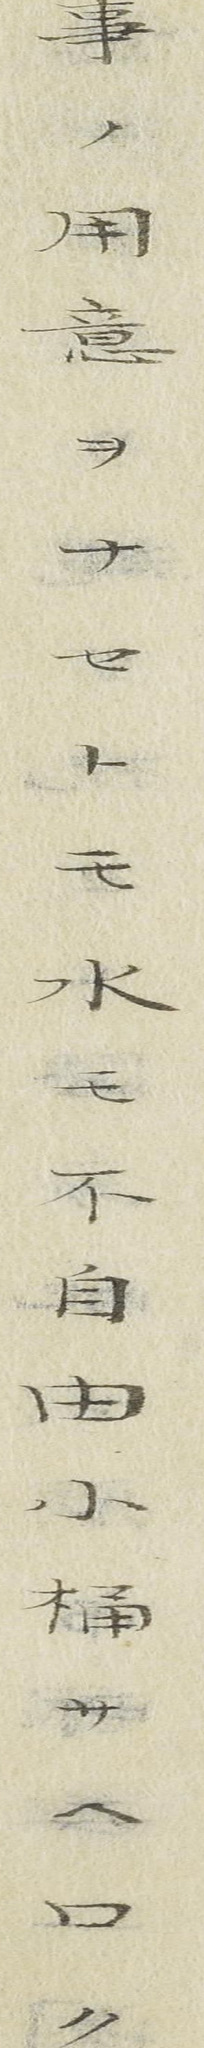事ノ用意ヲナセトモ水モ不自由小桶サヘロク
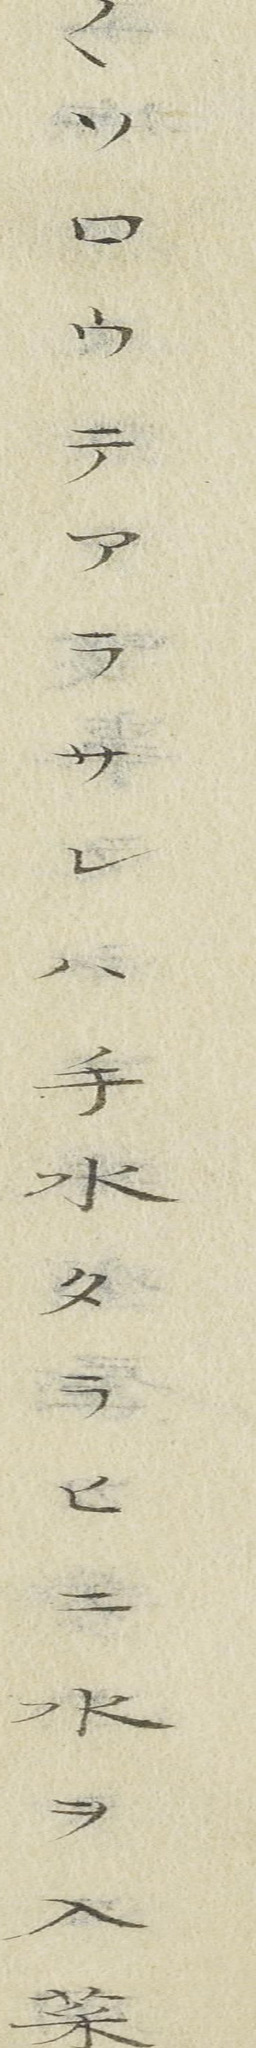〱ソロウテアラサレハ手水タラヒニ水ヲ入菜
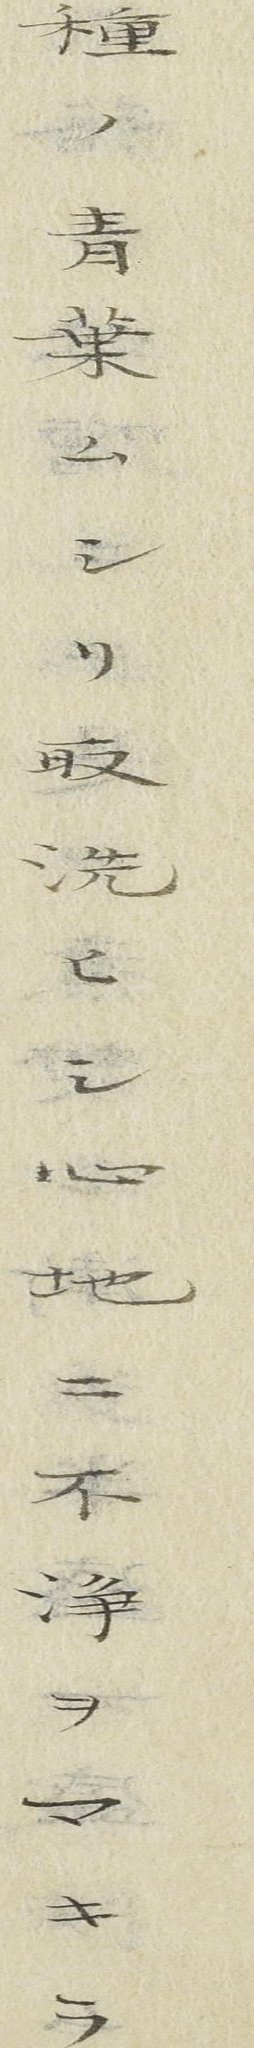種ノ青葉ムシリ取洗ヒシ心地ニ不浄ヲマキラ

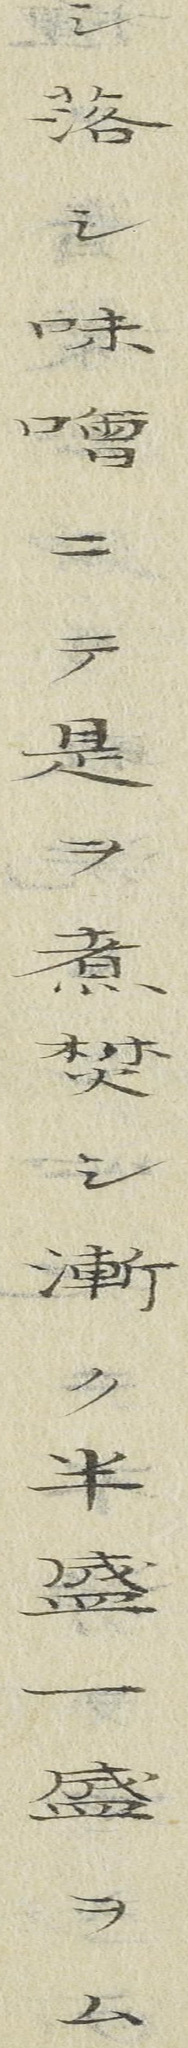シ落シ味噌ニテ是ヲ煮焚シ漸ク半盛一盛ヲム
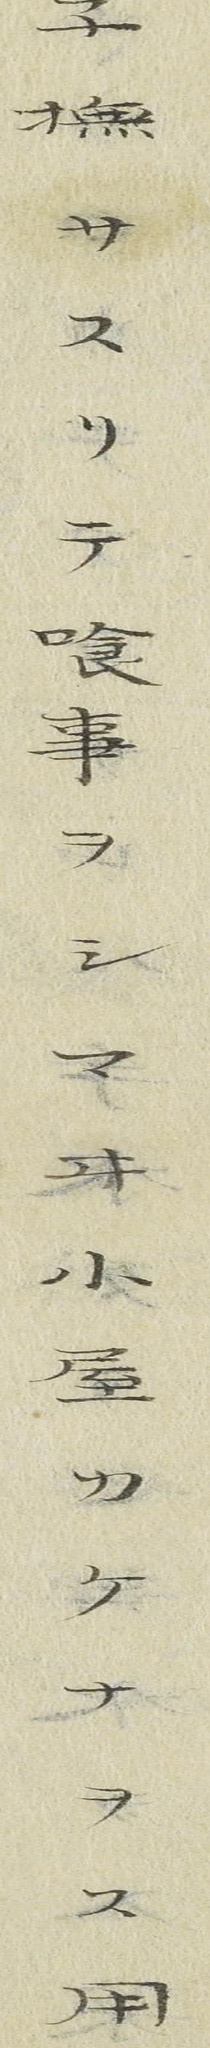子撫サスリテ喰事ヲシマヰ小屋カケナヲス用
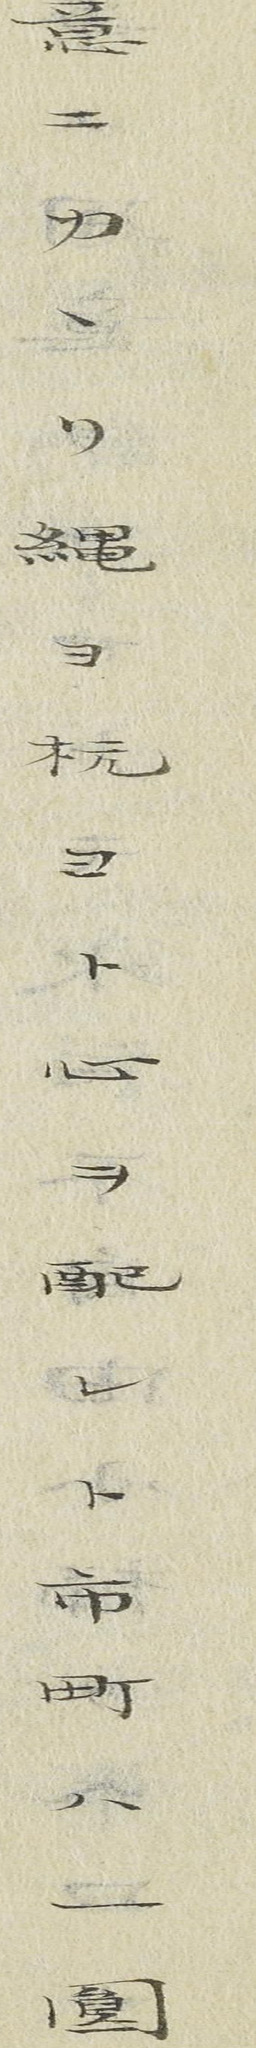意ニカヽリ縄ヲ杭ヨト心ヲ配レト市町ハ一円
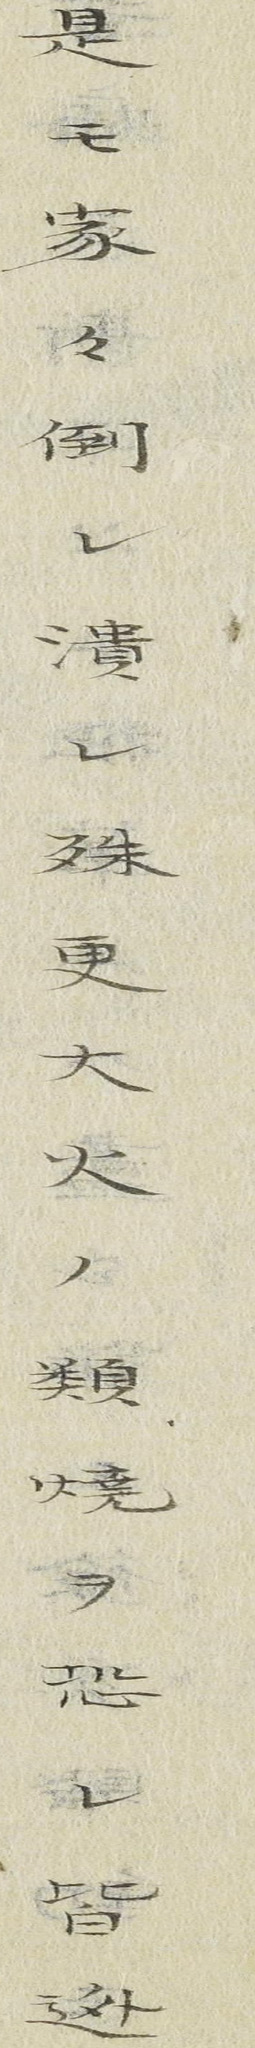是モ家々倒レ潰レ殊更大火ノ類焼ヲ恐レ皆迯
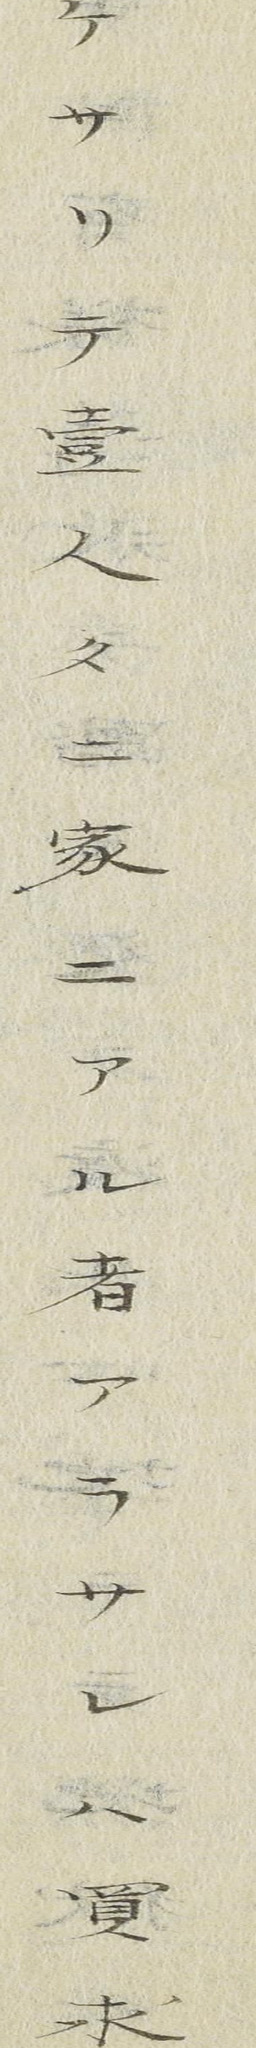ケサリテ壹人タニ家ニアル者アラサレハ買求
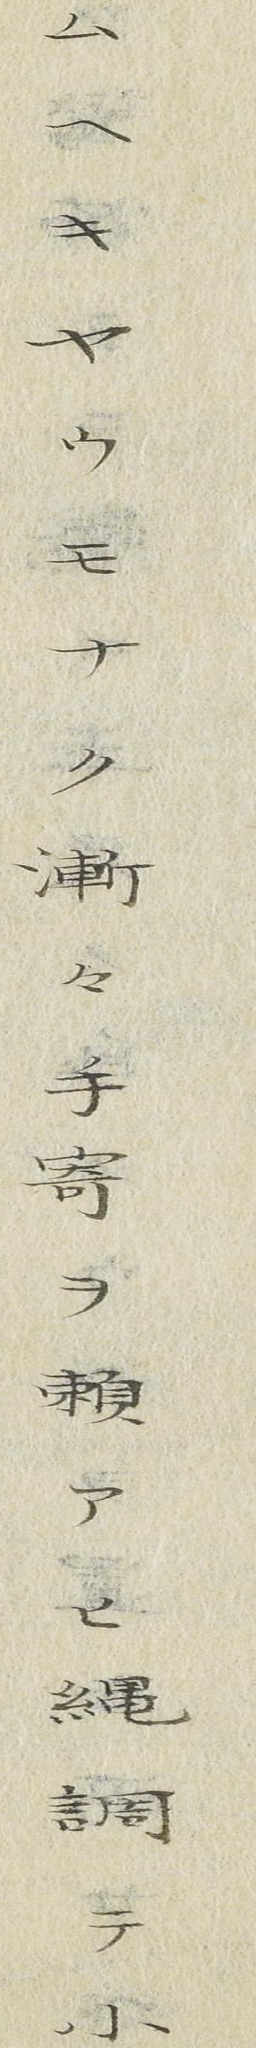ムヘキヤウモナク漸々手寄ヲ頼アヒ縄調テ小
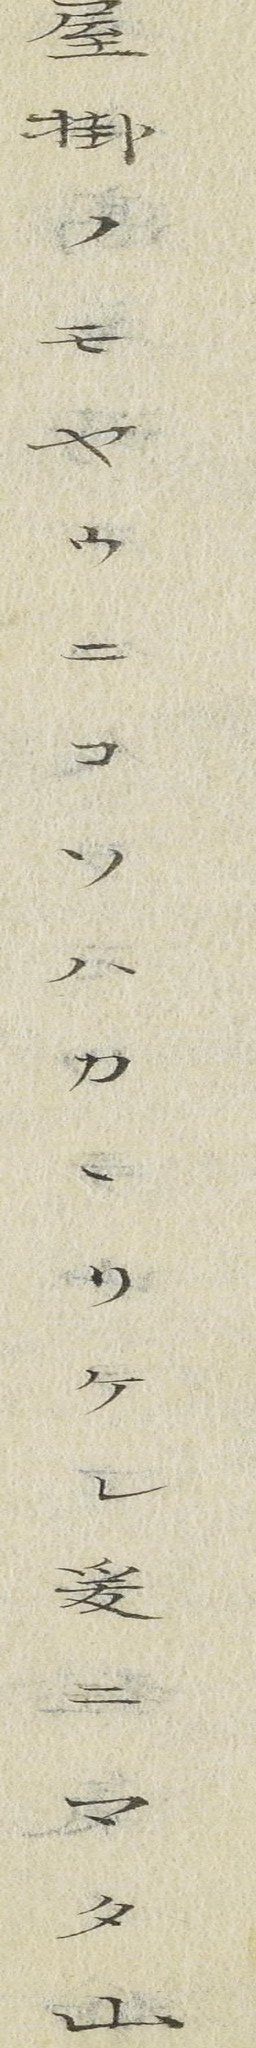屋掛ノモヤウニコソハカヽリケレ爰ニマタ山
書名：地災撮要　地震之部　巻ノ二
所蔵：東京大学地震研究所図書室 Earthquake Research Institute Library, The University of Tokyo, JAPAN
